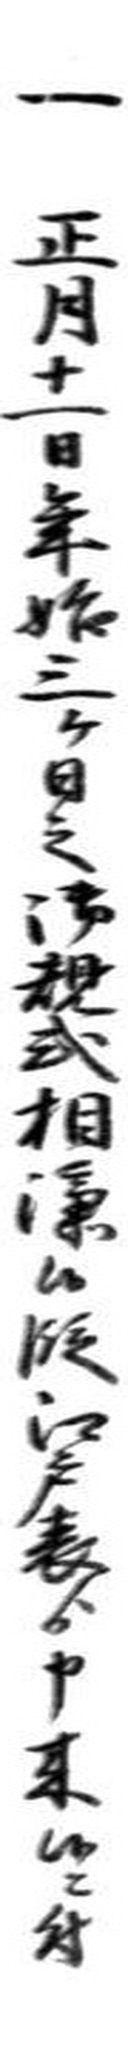一正月十一日年始三ケ日之御規式相済候段江戸表ゟ申来候ニ付
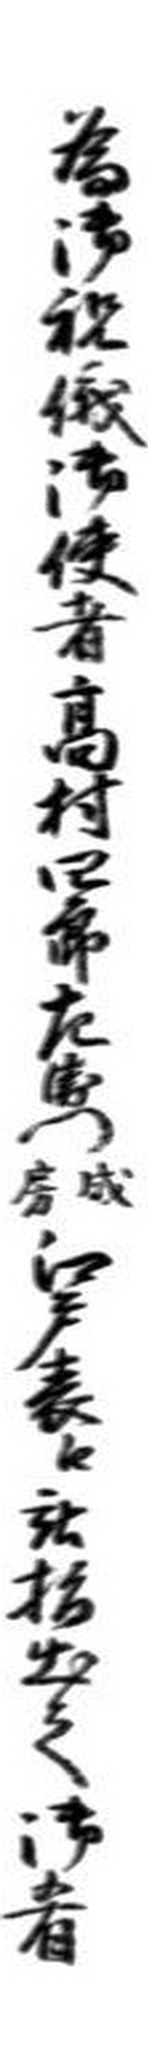為御祝儀御使者髙村四郎左衛門成房江戸表江被指出之御肴
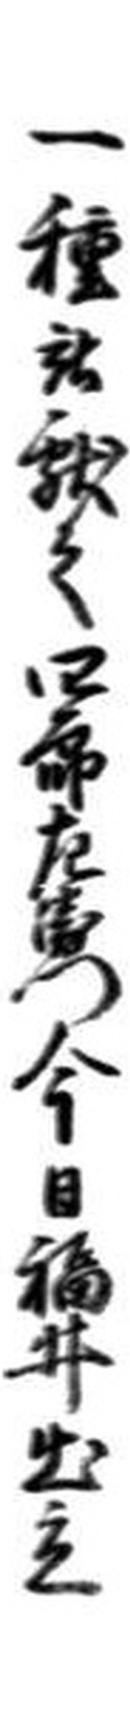一種被献之四郎左衛門今日福井出立
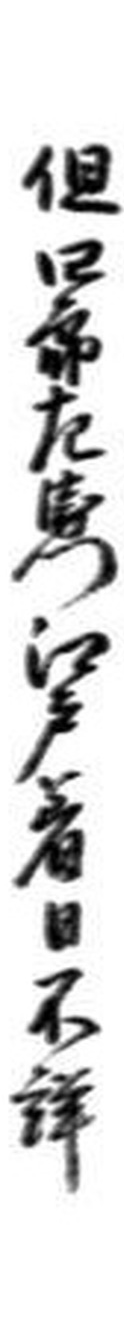但四郎左衛門江戸着日不詳
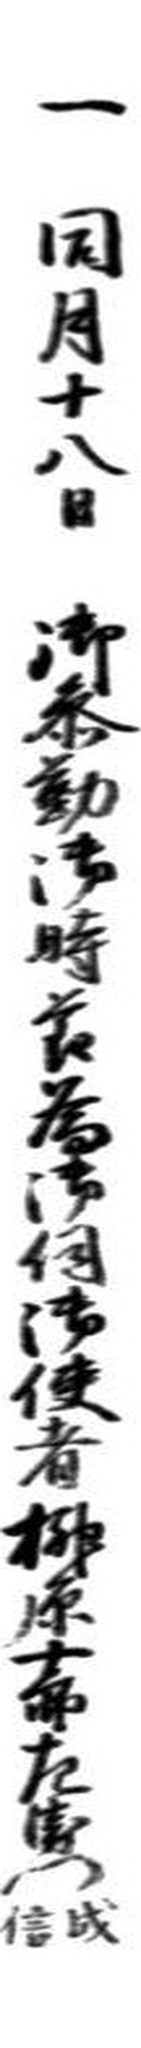一同月十八日御参勤御時節為御伺御使者榊原十郎左衛門成信
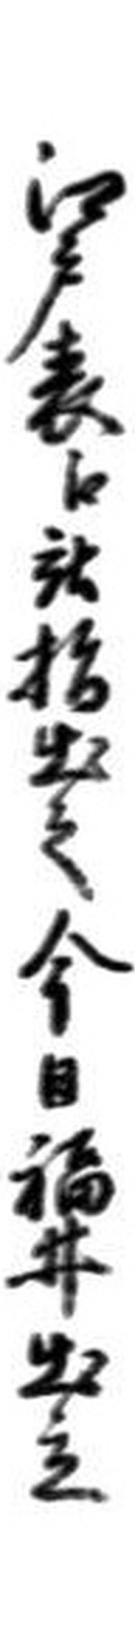江戸表江被指出之今日福井出立
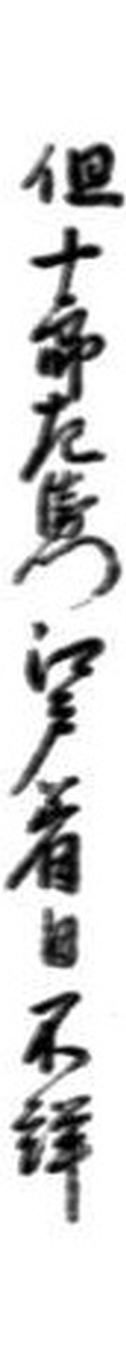但十郎左衛門江戸着日不詳
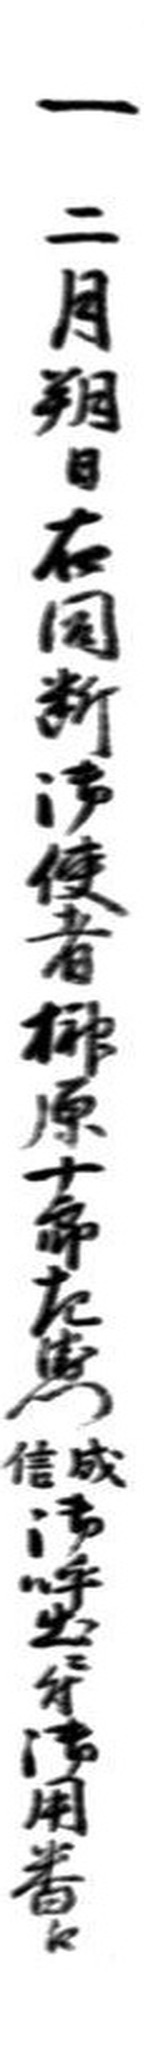一二月朔日右同断御使者榊原十郎左衛門成信御呼出ニ付御用番江
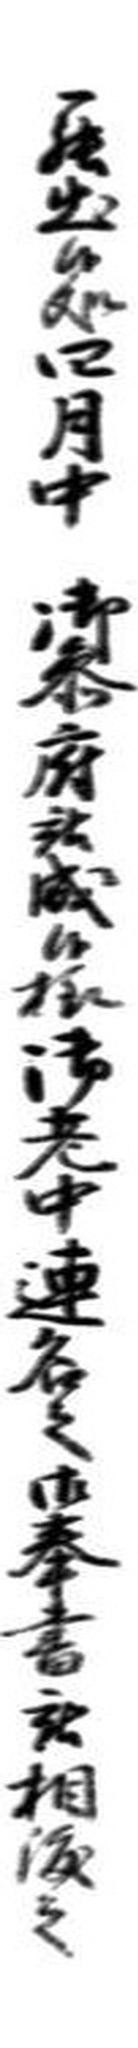罷出候処四月中御参府被成候様御老中連名之御奉書被相渡之
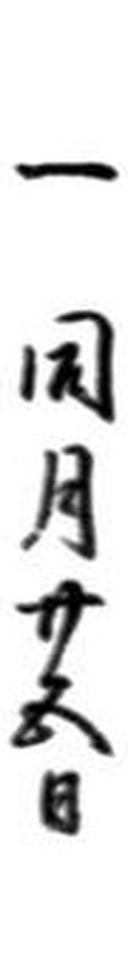一同月廿五日

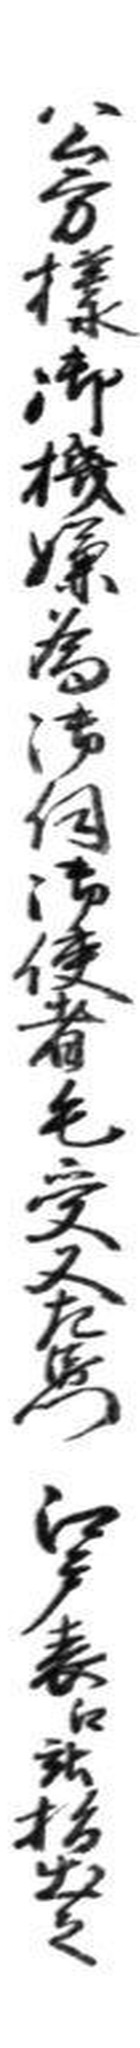公方様御機嫌為御伺御使者毛受又左衛門江戸表江被指出之
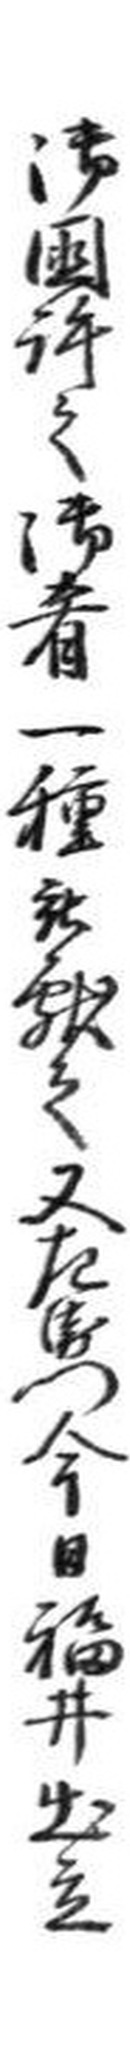御国許之御肴一種被献之又左衛門今日福井出立
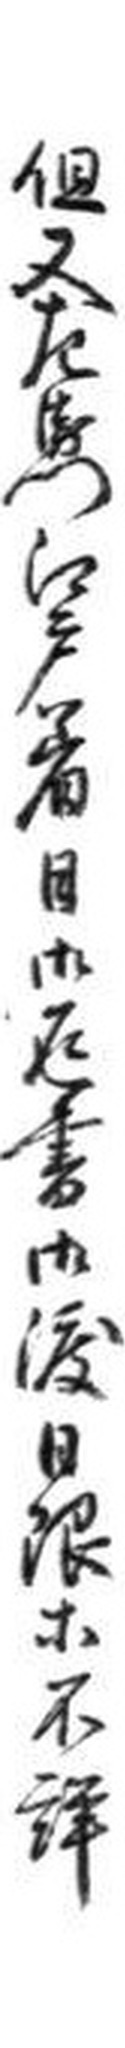但又左衛門江戸着日御返書御渡日限等不詳
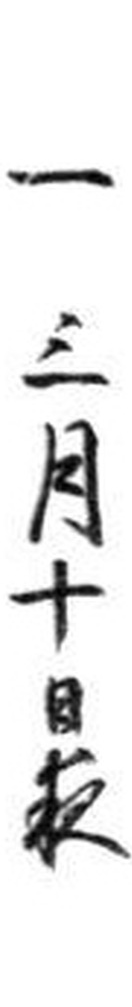一三月十日夜
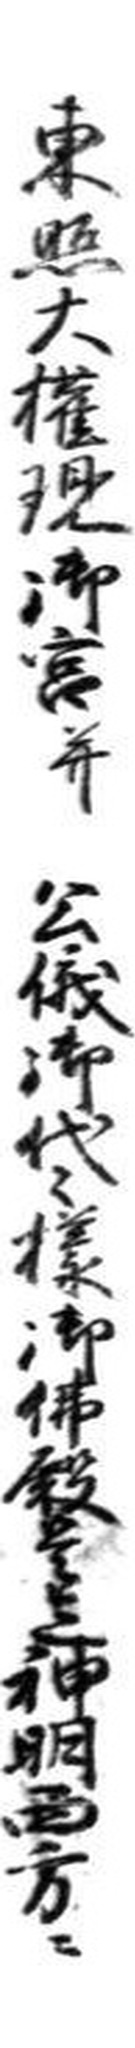東照大権現御宮并公儀御代々様御仏殿是迄神明西方ニ
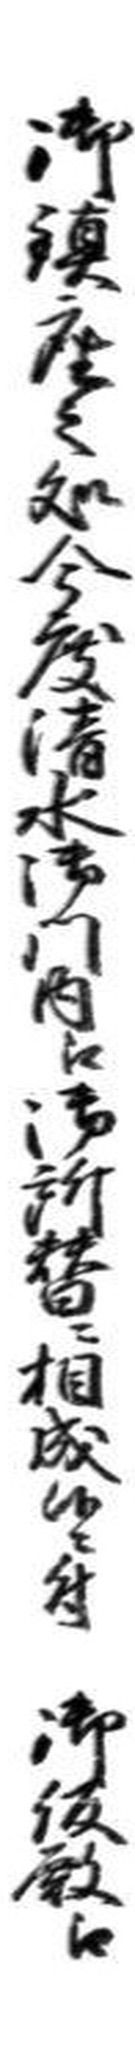御鎮座之処今度清水御門内江御所替ニ相成候ニ付御仮殿江
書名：家譜 八 光通公 従寛文十年到同十二年
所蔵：福井県文書館 Fukui Prefectural Archives
